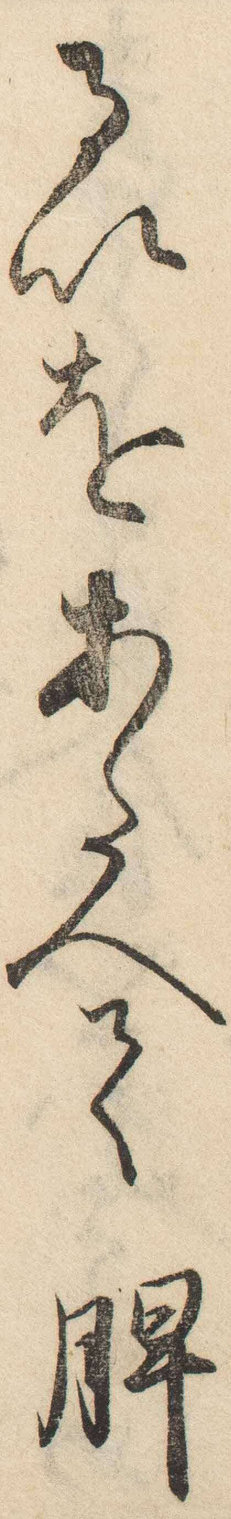るいをあたへて脾
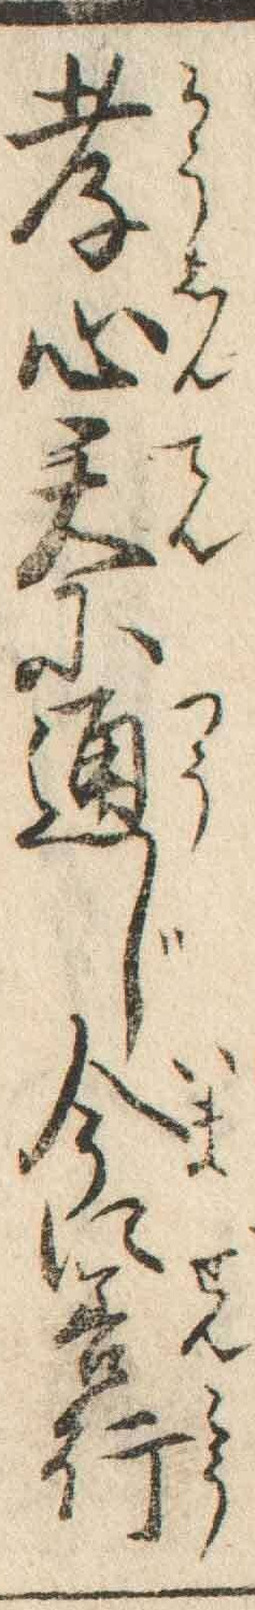孝心天に通じ今に善行
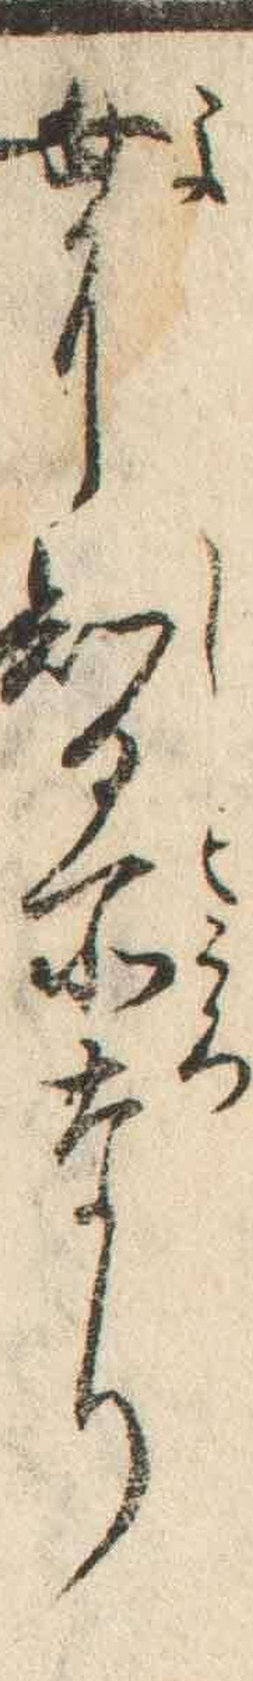世に知る所なり
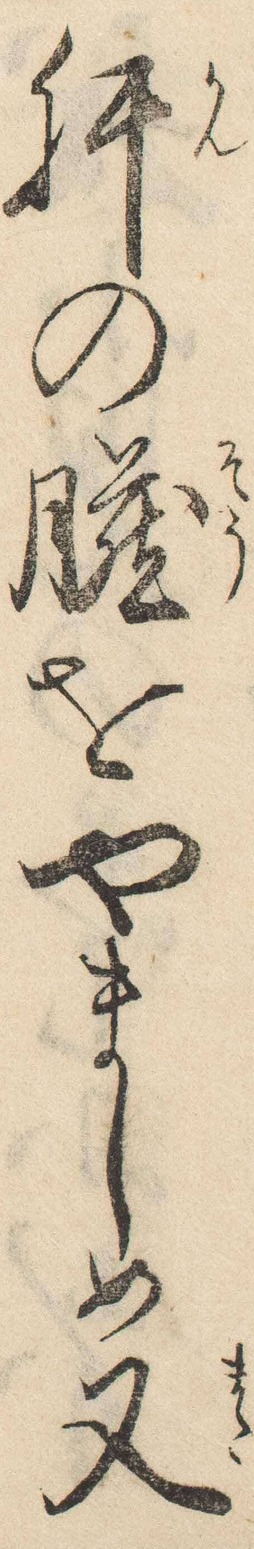肝の臓をやましめ又
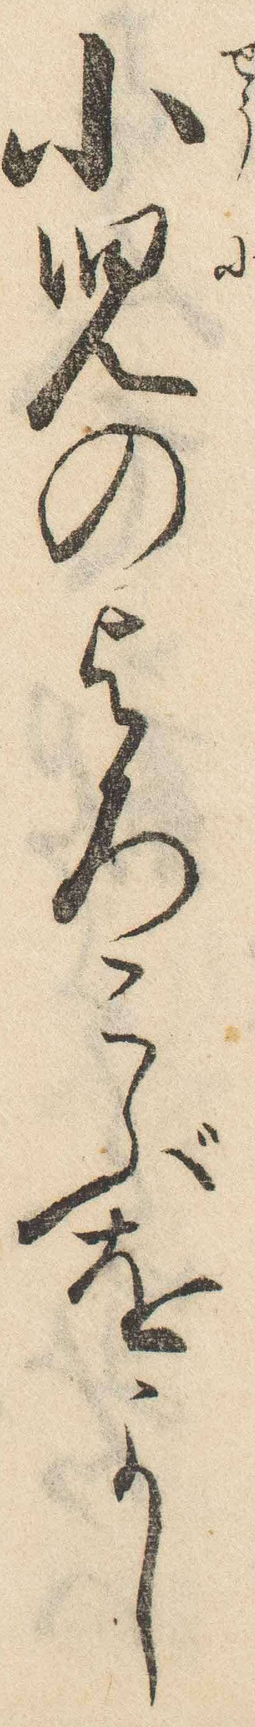小児のよろこぶをよし
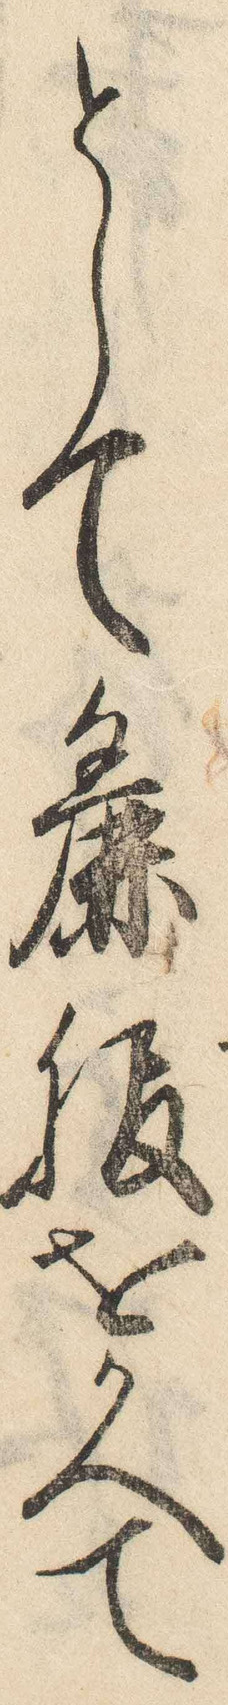として麁服をかへて
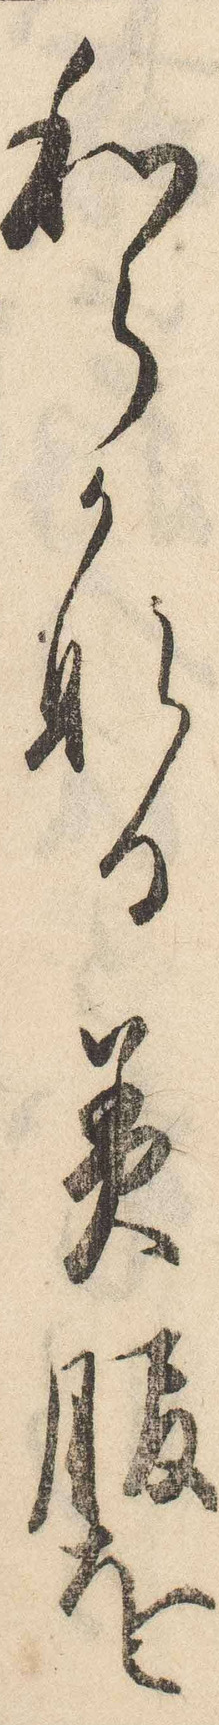和らかなる美服を
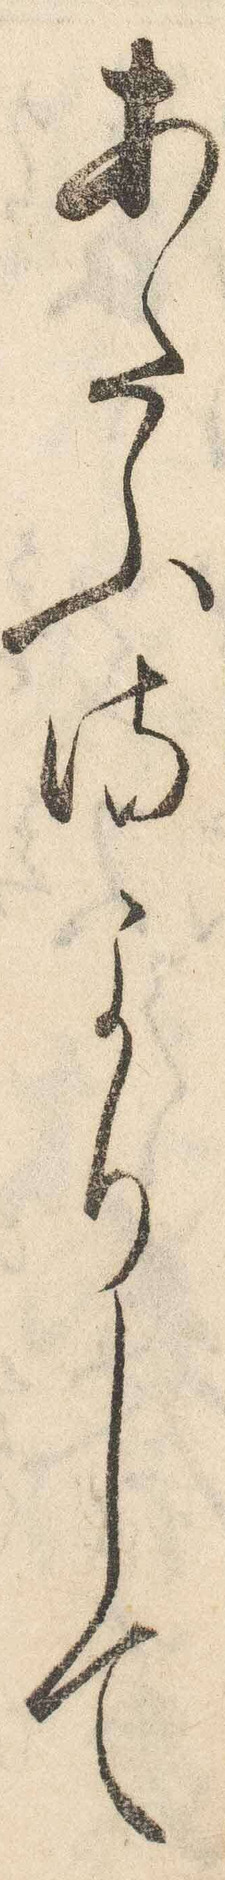あたふるよりして
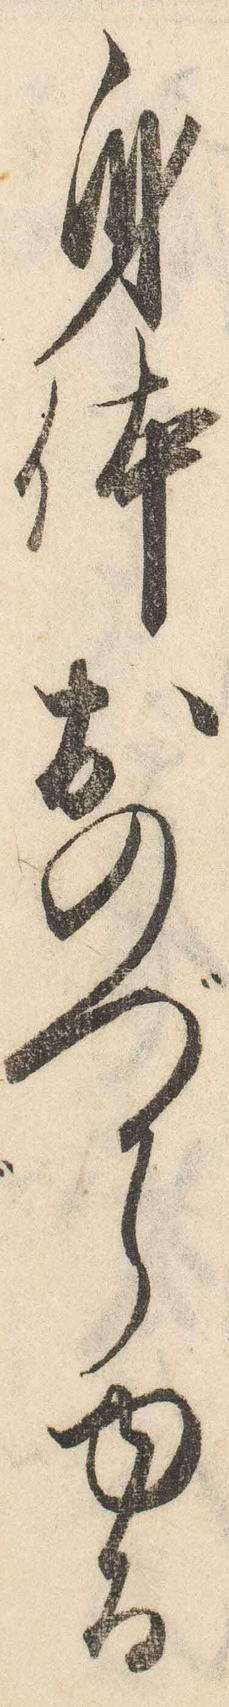身体おのづからゆる
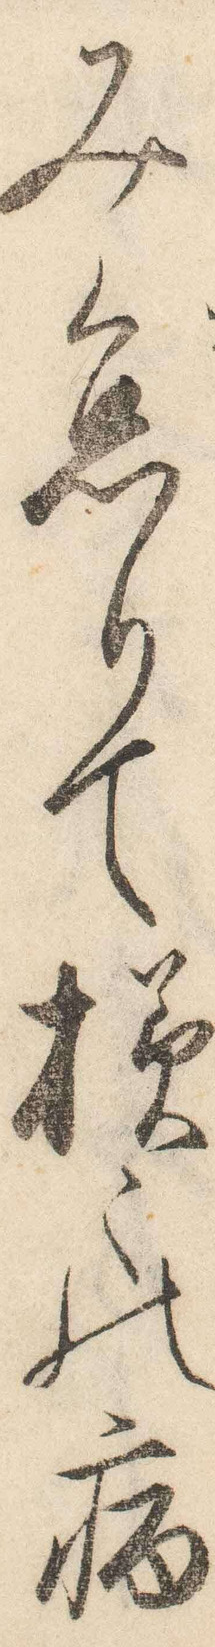み怠りて様々の病
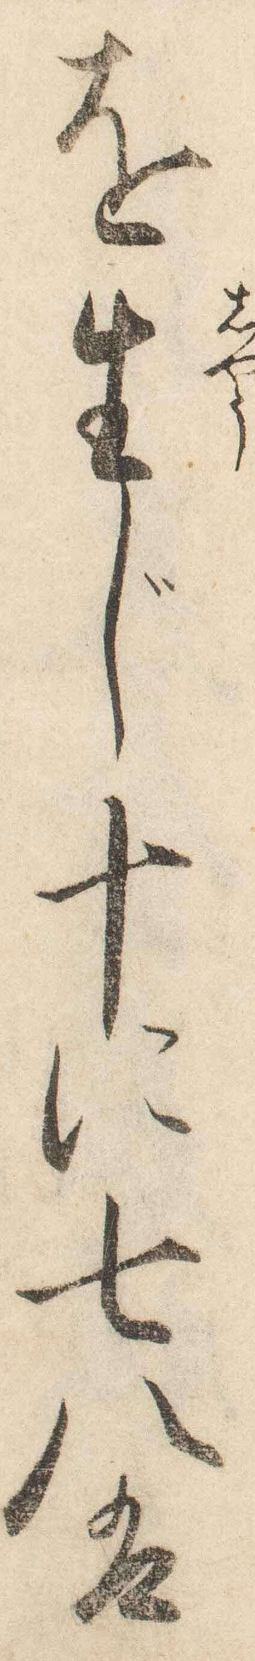を生じ十に七八は
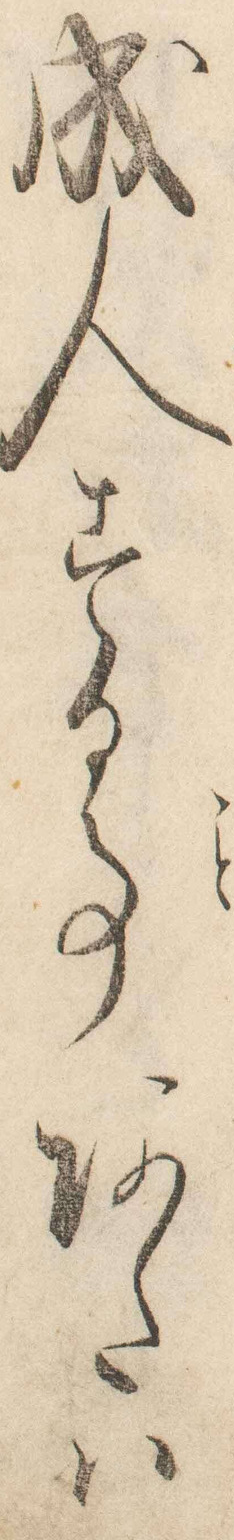成人する事あたは
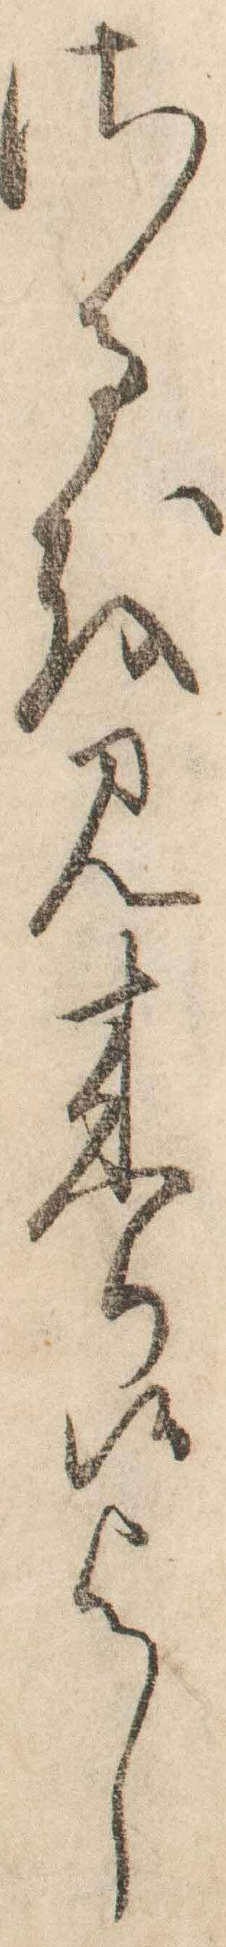さるを見来り候よし

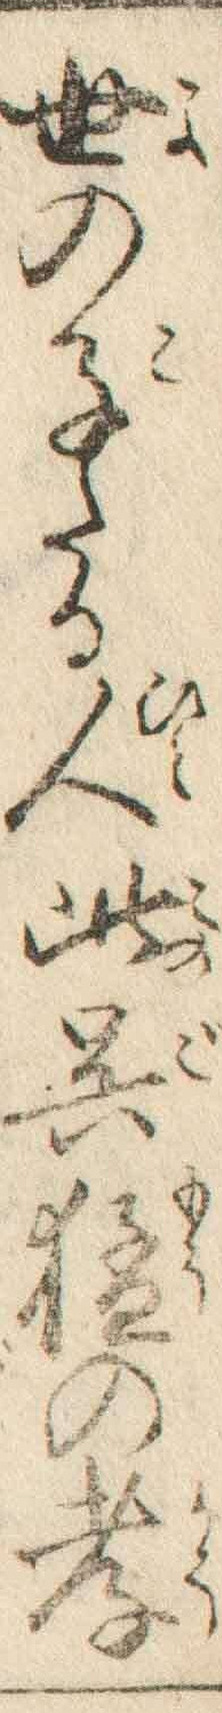世の子たる人此呉猛の孝
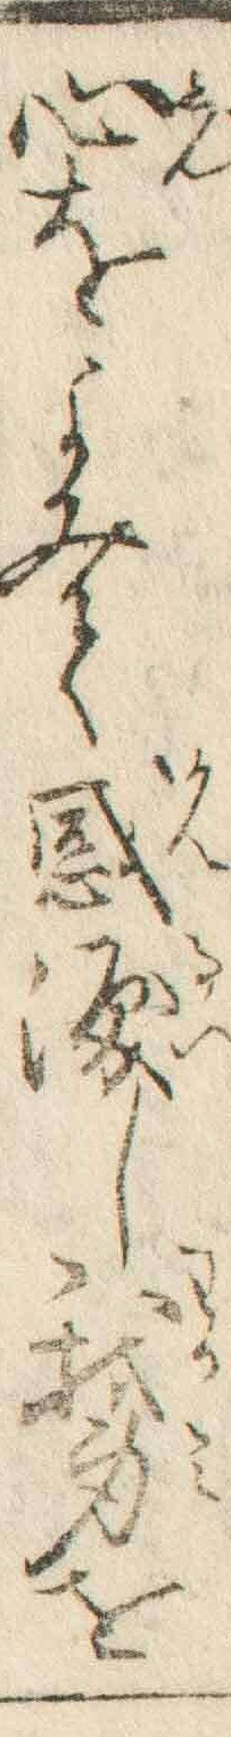心をよみて感涙し我身を
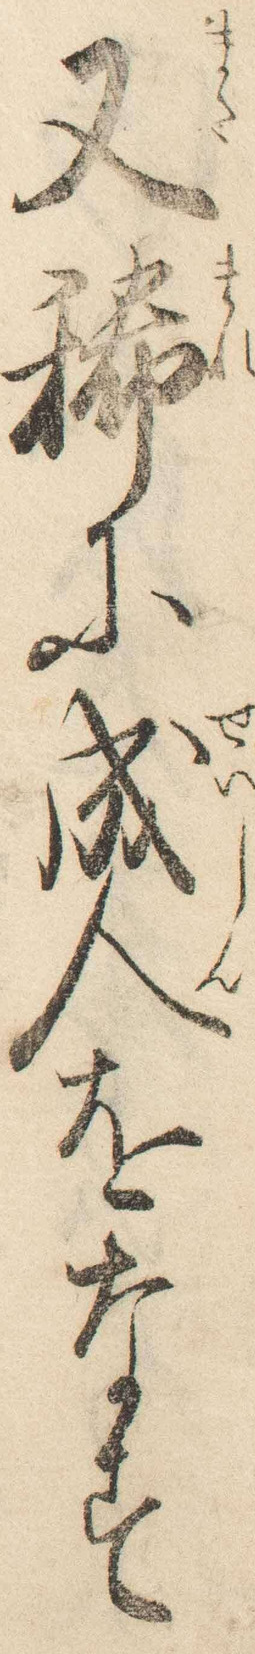又稀に成人をなす
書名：撫育草
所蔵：東京学芸大学附属図書館 国文学研究資料館
